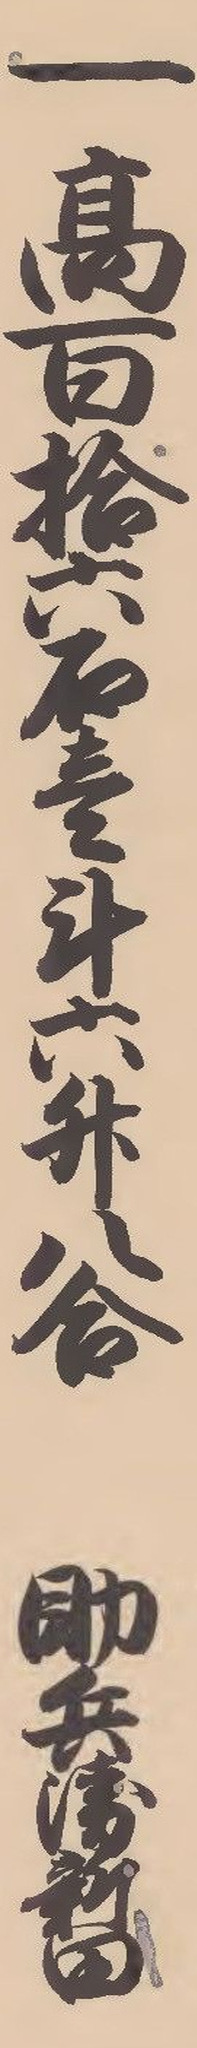一高百拾六石壱斗六升八合助兵衛新田
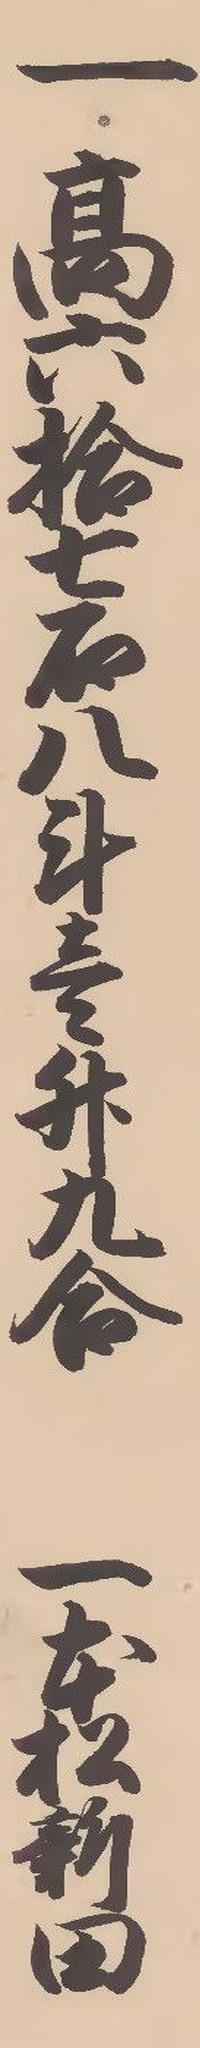一高六拾七石八斗壱升九合一本松新田
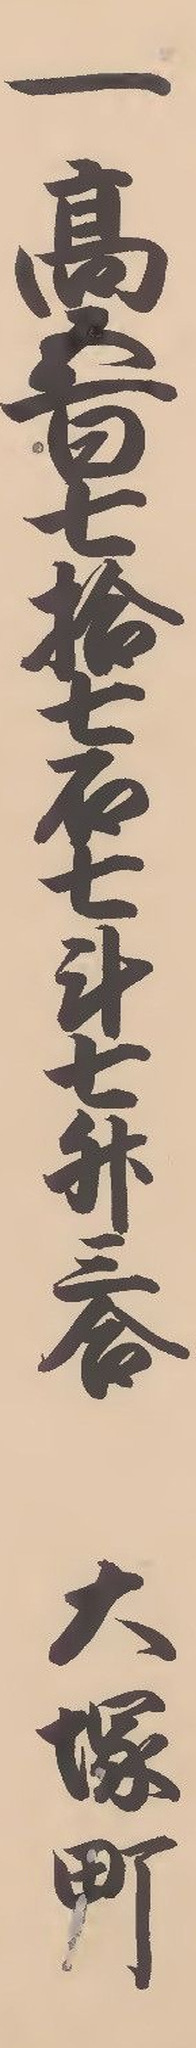一高五百七拾七石七斗七升三合大塚町
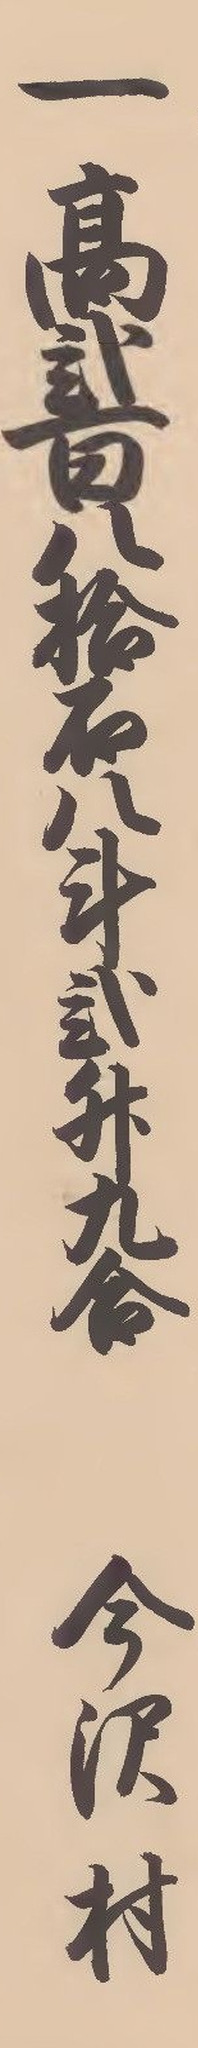一高弐百八拾石八斗弐升九合今沢村
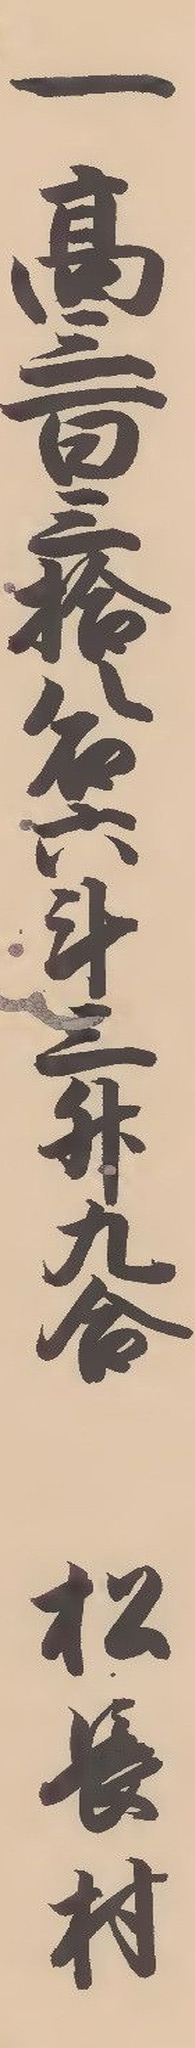一高三百三拾八石六斗三升九合松長村

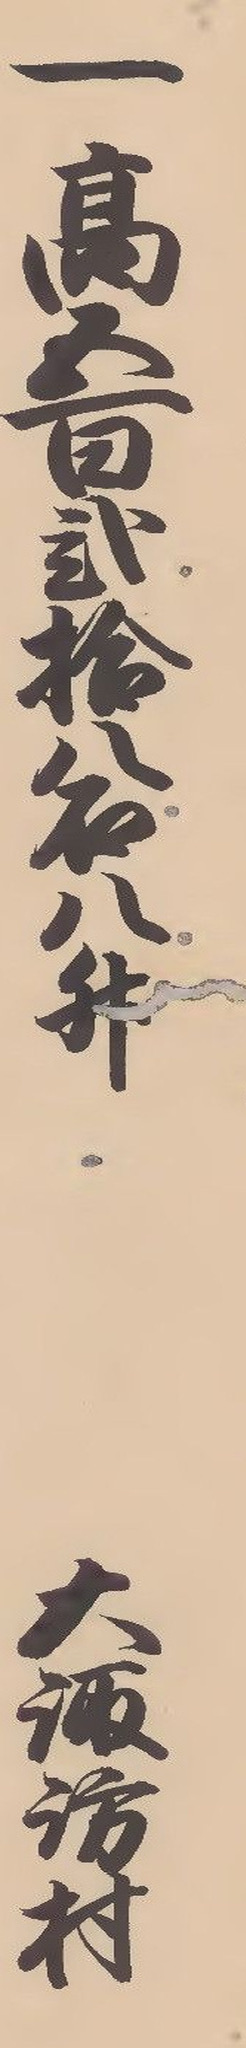一高五百弐拾八石八升大諏訪村
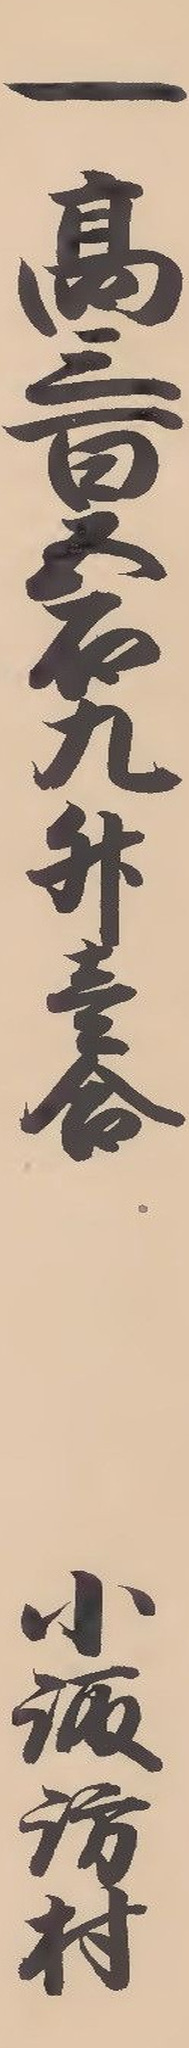一高三百五石九升壱合小諏訪村
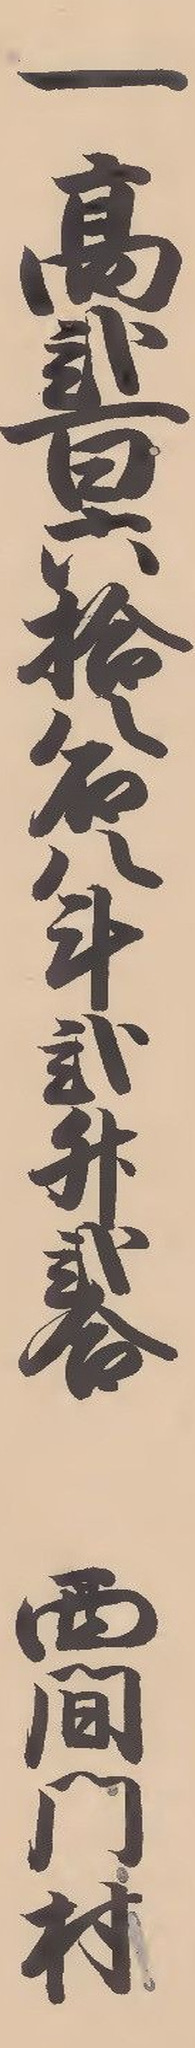一高弐百六拾八石八斗弐升弐合西間門村
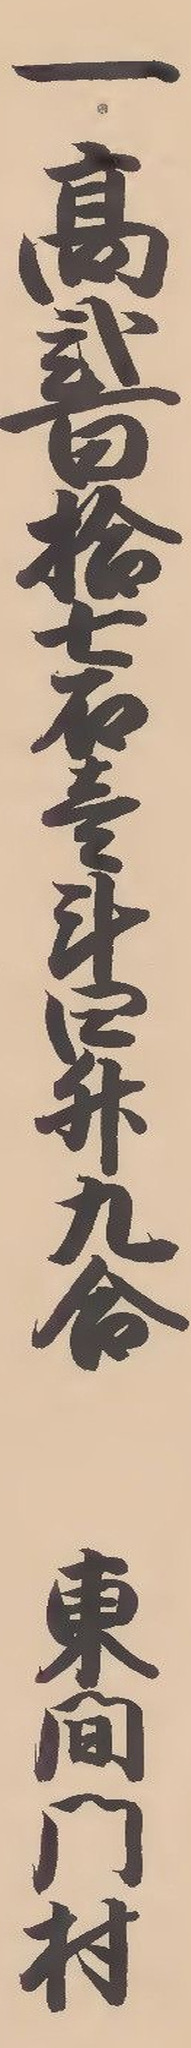一高弐百拾七石壱斗四升九合東間門村
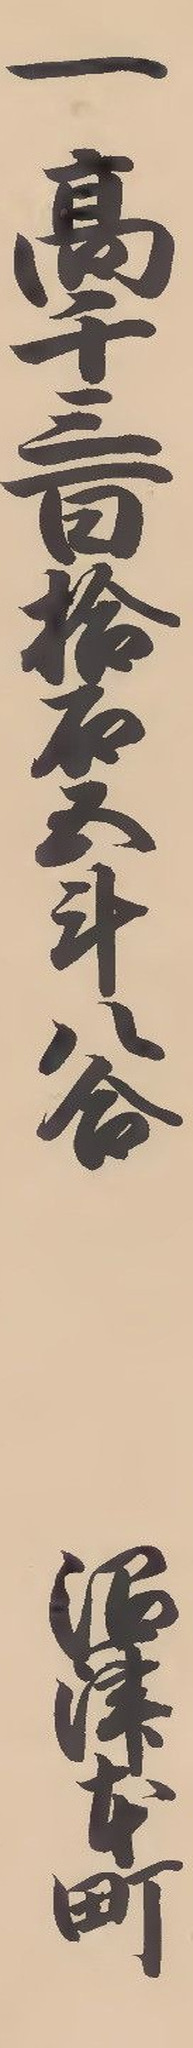一高千三百拾石五斗八合沼津本町
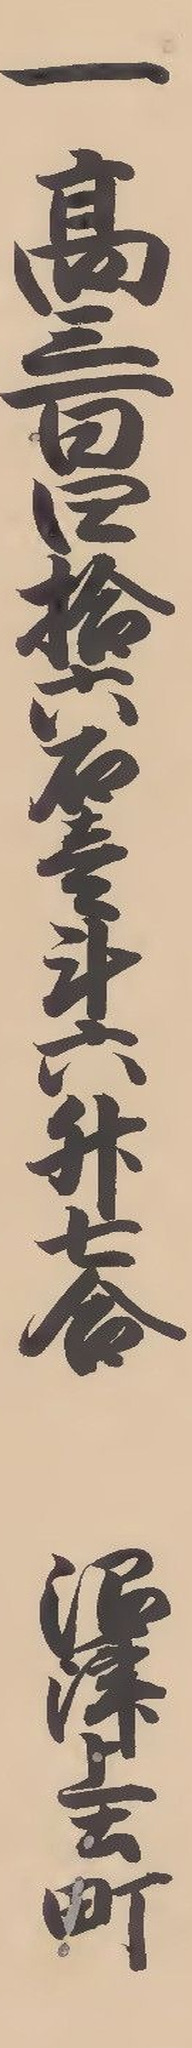一高三百四拾六石壱斗六升七合沼津上土町
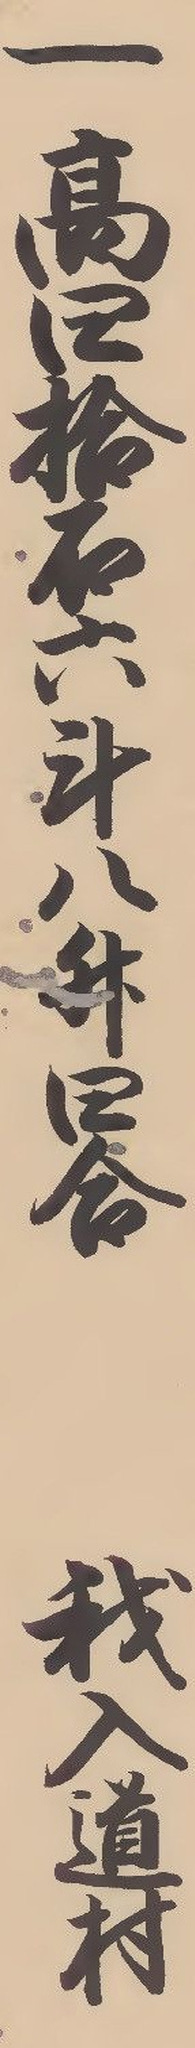一高四拾石六斗八升四合我入道村

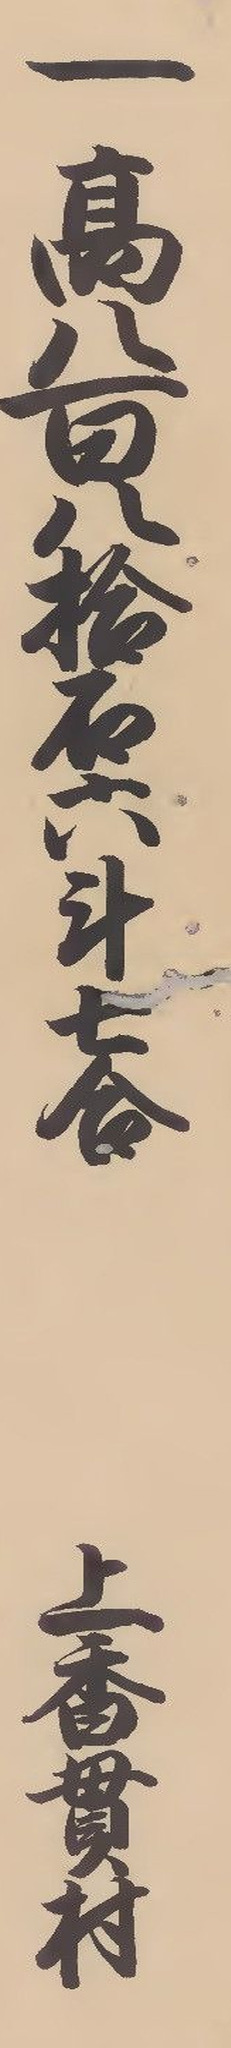一高八百八拾石六斗七合上香貫村
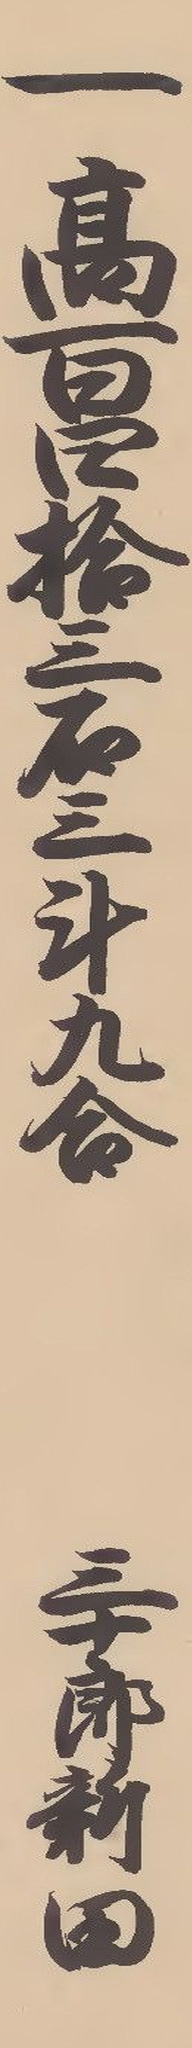一高百四拾三石三斗九合三十郎新田
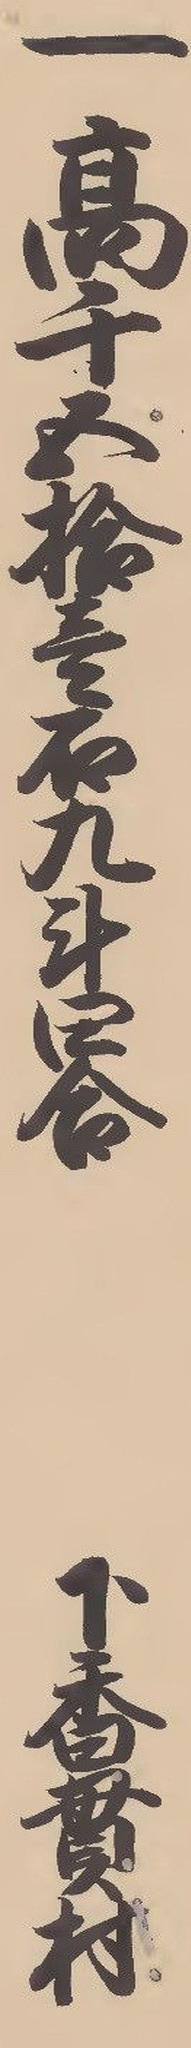一高千五拾壱石九斗四合下香貫村
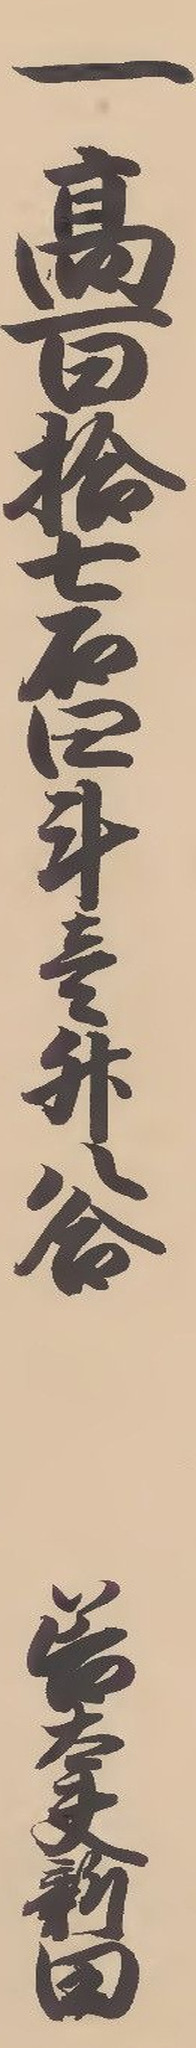一高百拾七石四斗壱升八合善太夫新田
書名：駿河国郷帳
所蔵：国立公文書館 National Archives of Japan
